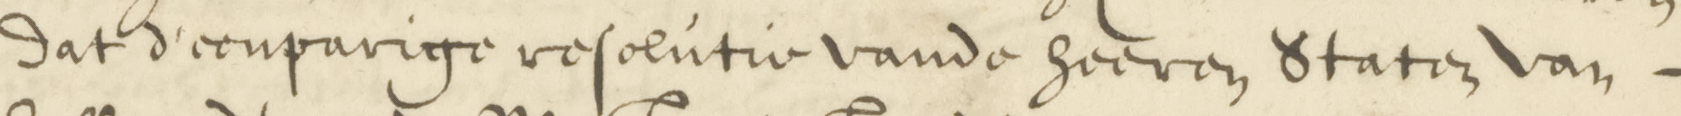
dat d'eenparige resolutie vande heeren Staten van
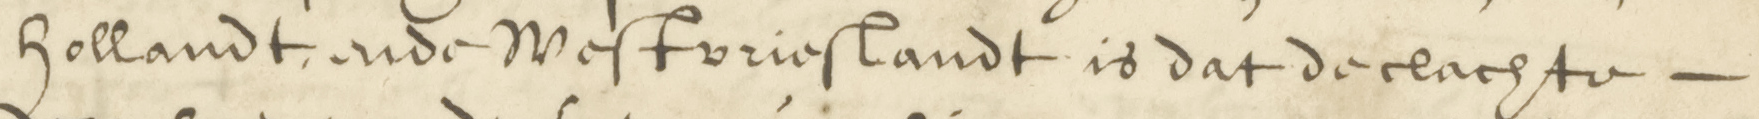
hollandt, ende Westvrieslandt is dat de clachte
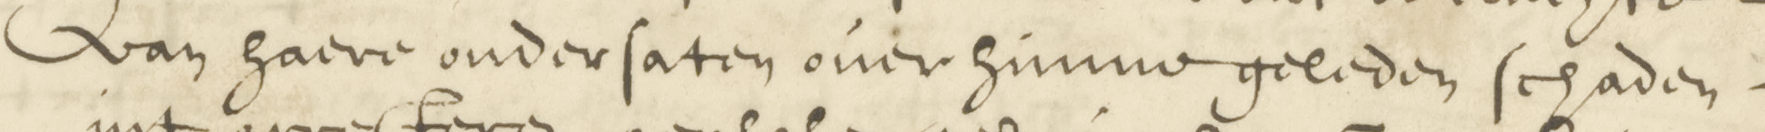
van haere ondersaten ouer hunne geleden schaden
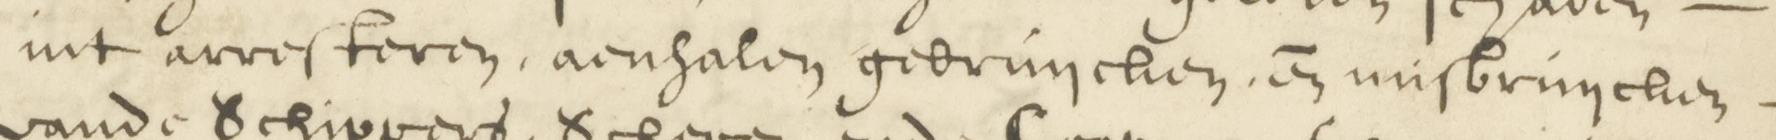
int arresteren, aenhalen gebruycken, en misbruycken
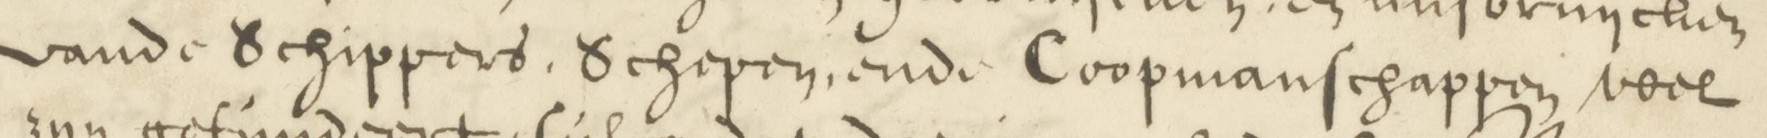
vande Schippers, Schepen, ende Coopmanschappen wel
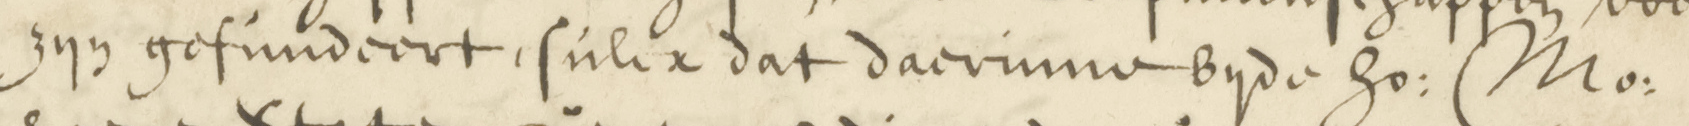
zyn gefundeert, sulcx dat daerinne byde ho:Mo:
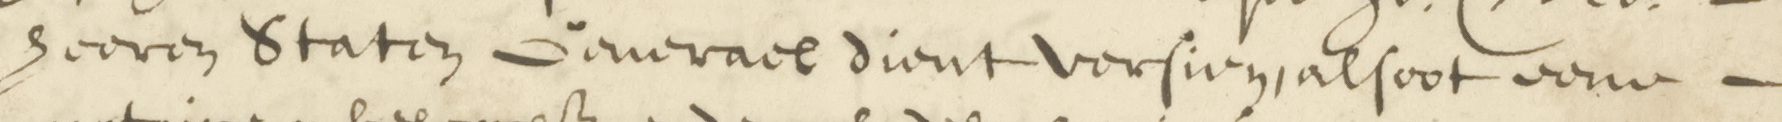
heeren Staten Generael dient versien, alsoot eene
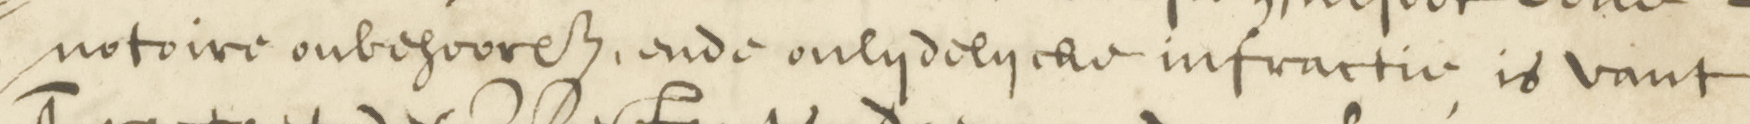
notoire onbehoorl, ende onlydelycke infractie is vant
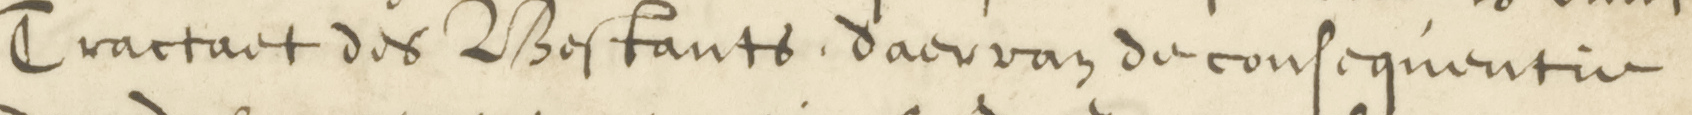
Tractaet des Bestants, daervan de consequentie
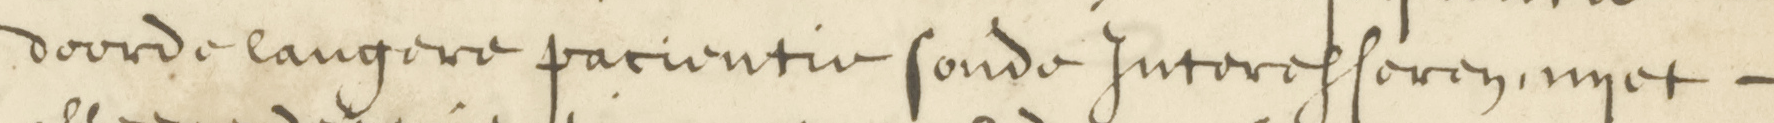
door de langere pacientie soude Interesseren, nyet
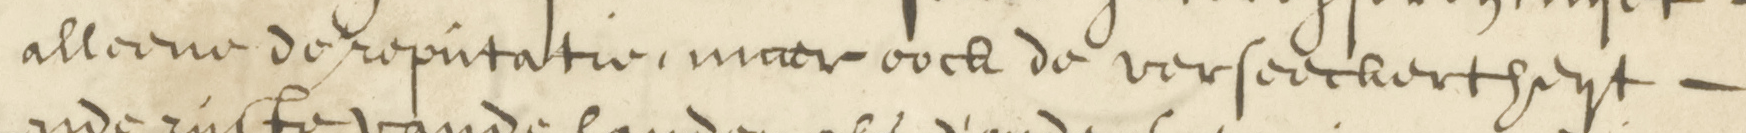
alleene de reputatie, maer oock de verseeckertheyt
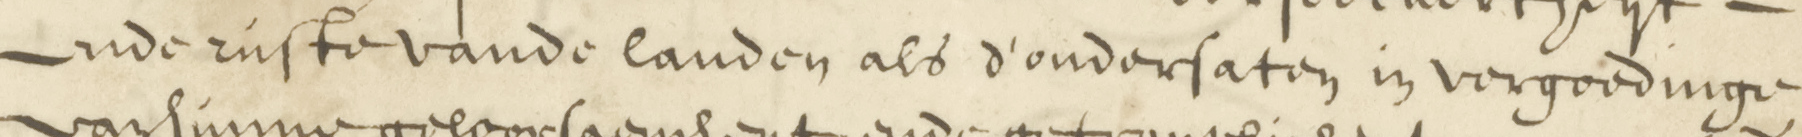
ende ruste vande landen als d'ondersaten in vergoedinge
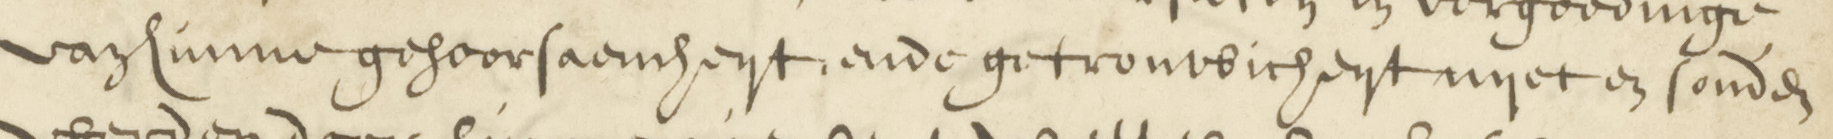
van hunne gehoorsaemheyt, ende getrouwicheyt nyet en souden
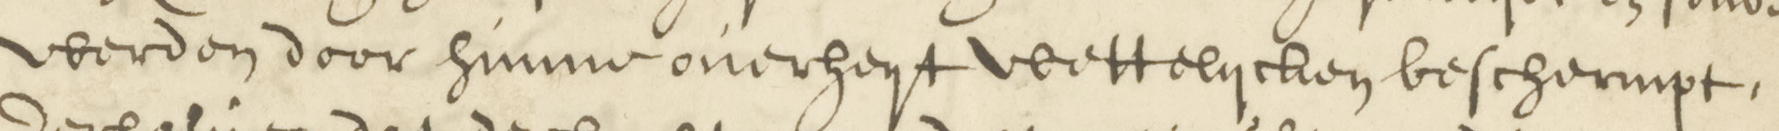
werden door hunne ouerheyt wettelycken beschermpt.
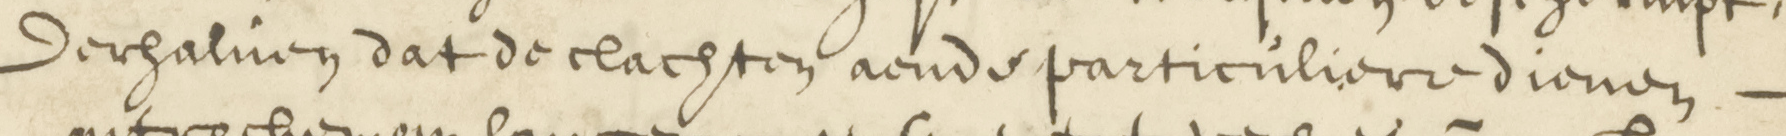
Derhaluen dat de clachten aende particuliere dienen
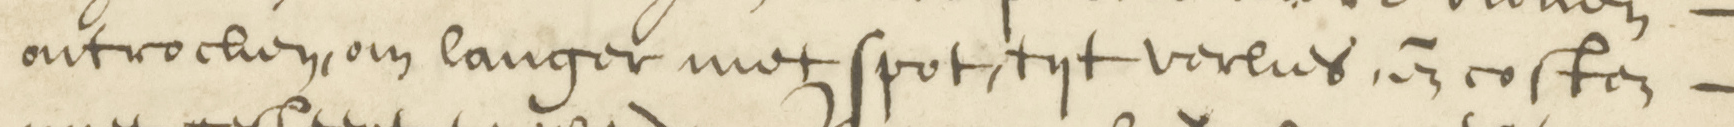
ontrocken, om langer met spot, tytverlies, en costen
